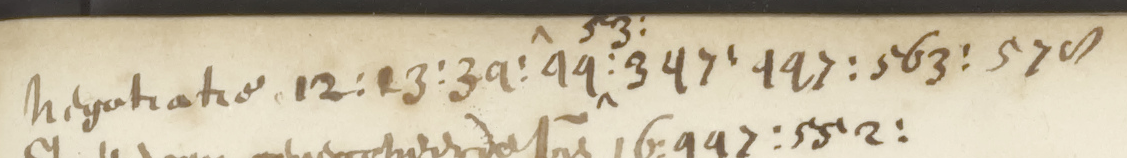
negotiatie 12: 13: 34: ^44:53:347: 447: 563: 578
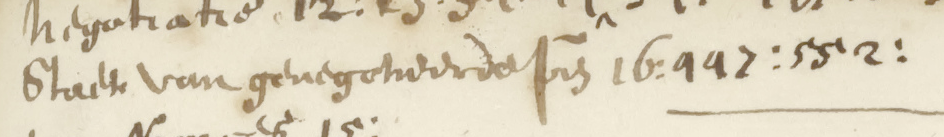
Staet van genegotieerde pen 16: 447: 552:
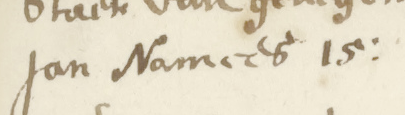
jan Namces 15:
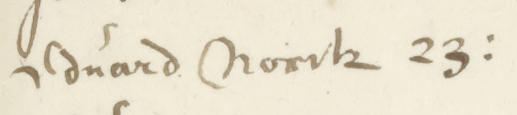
Eduard Noritz 23:
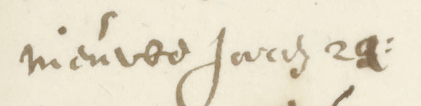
nieuwe Jaren 29:
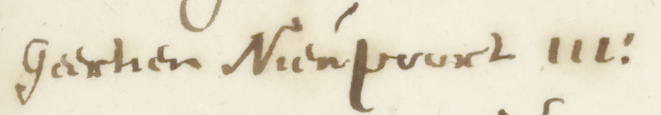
Geertien Nieupoort 111:
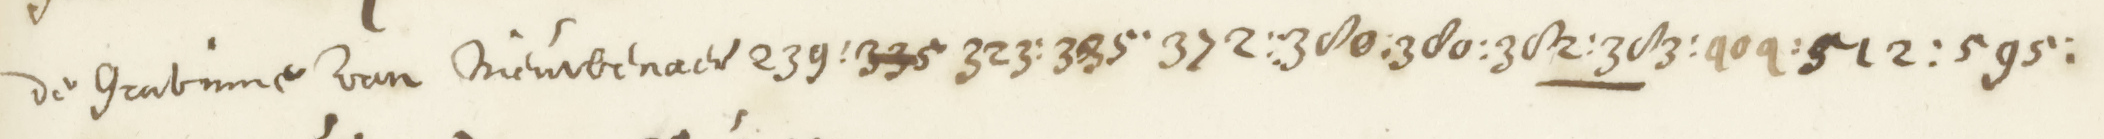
de Gravinne van Nieuwenaar 239: 335 323: 335: 372: 380: 382: 383: 404: 512, 595:
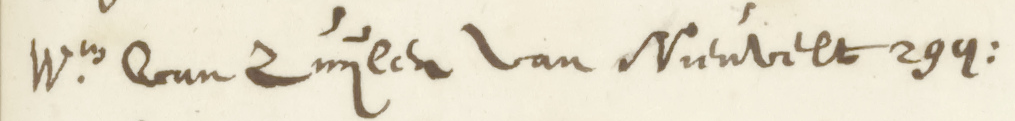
Wm. van Zuijlen van Nieuvelt 294:
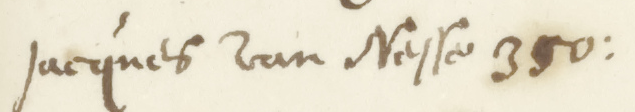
jacques van Nesse 350:
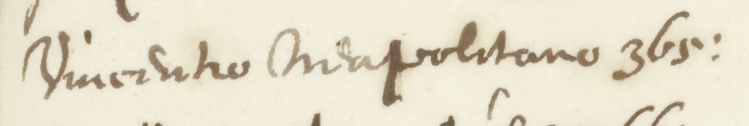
Vincentio Neapolitano 365:
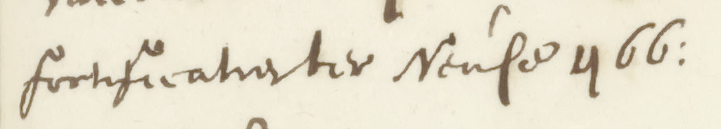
fortificatien ter Neuse 466:
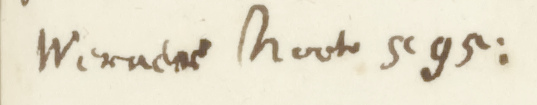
Weraer Noot 595:
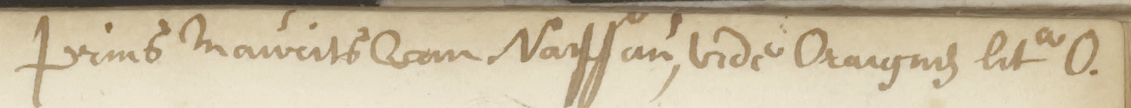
Prins maurits van Nassau, vide Oraignen lita O.
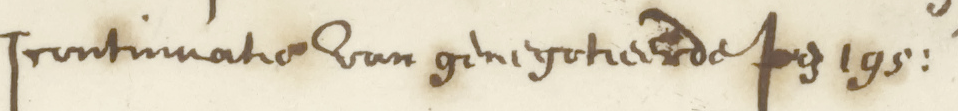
continuatie van genegotieerde pen 195:
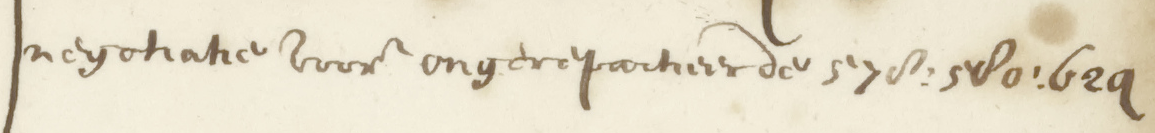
negotiatie voor ongerepartieerde 578: 580: 624
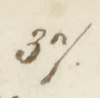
37
